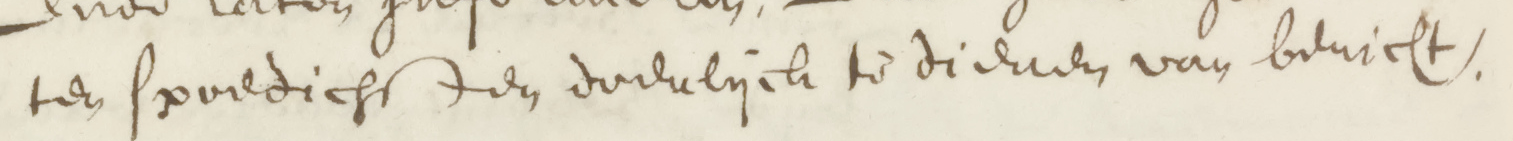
ten spoedichsten doenlijck te dienen van bericht.
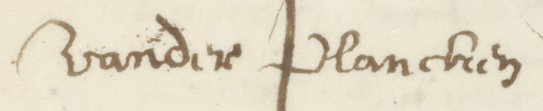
vander Plancken
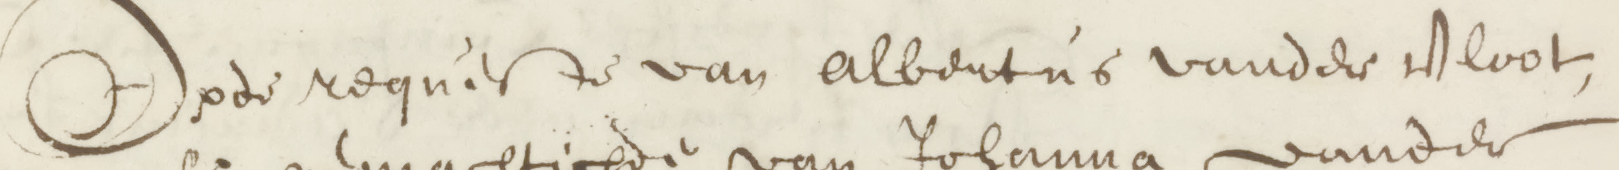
Opde requeste van Albertus vander Vloot,
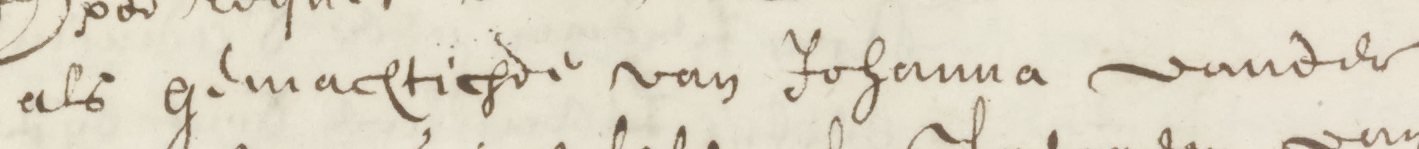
als gemachtichde van Johanna vander
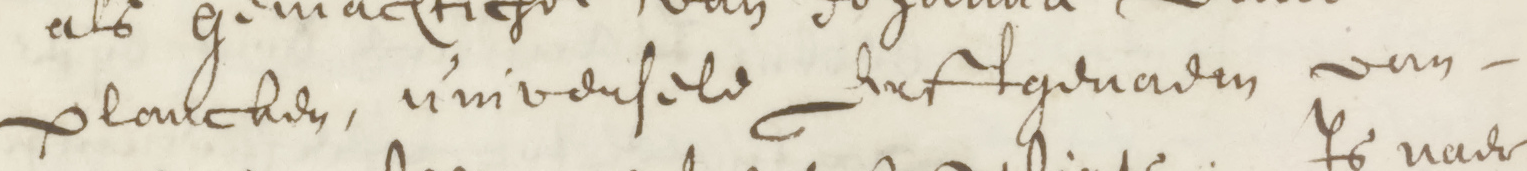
Plancken, universele Erffgenaem van -
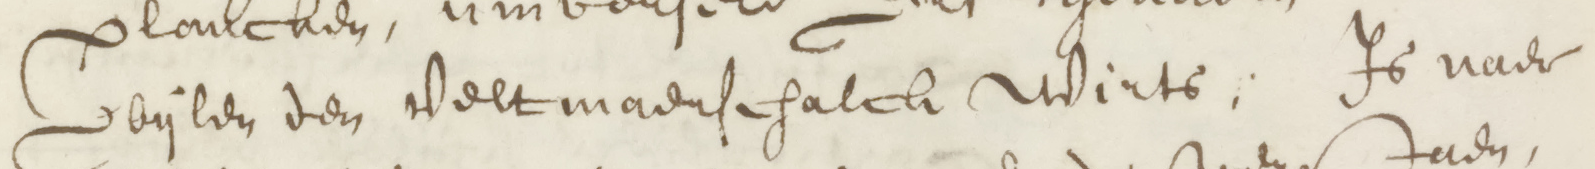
wijlen den Veltmaerschalck Wirts; Is naer
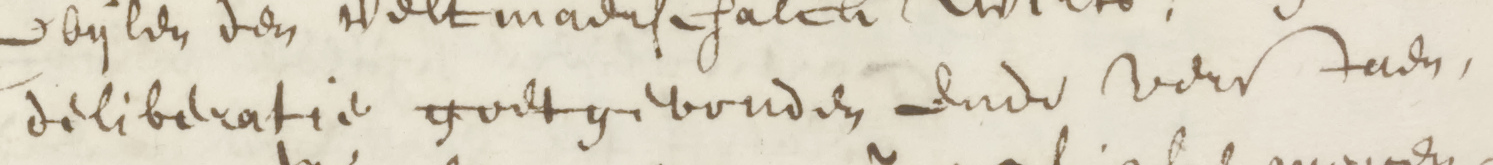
deliberatie goetgevonden ende verstaen,
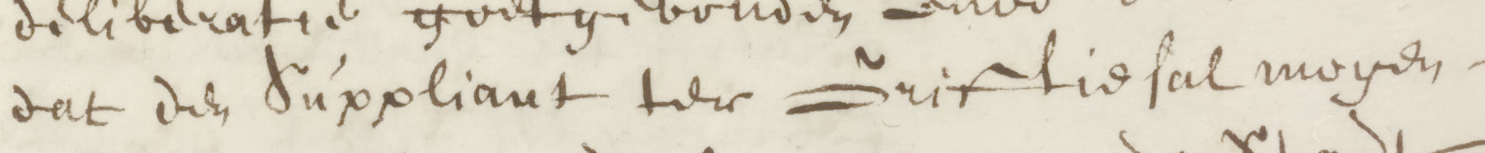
dat den Suppliant ter Griffie sal mogen
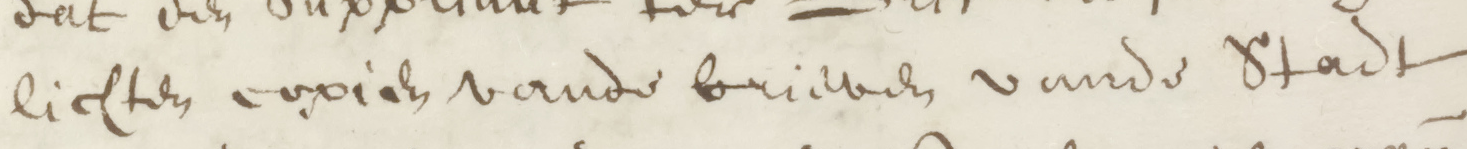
lichten copien vande brieven vande Stadt
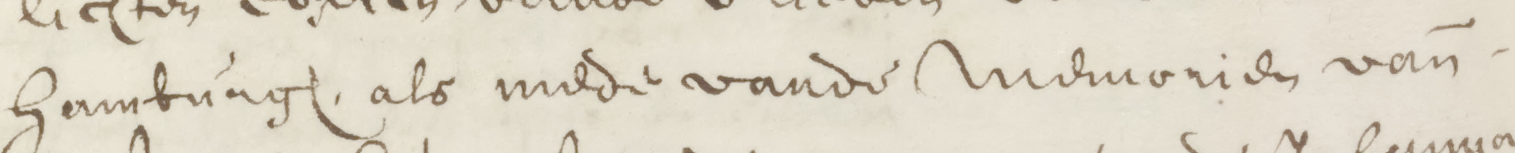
Hamburgh, als mede vande memorien van
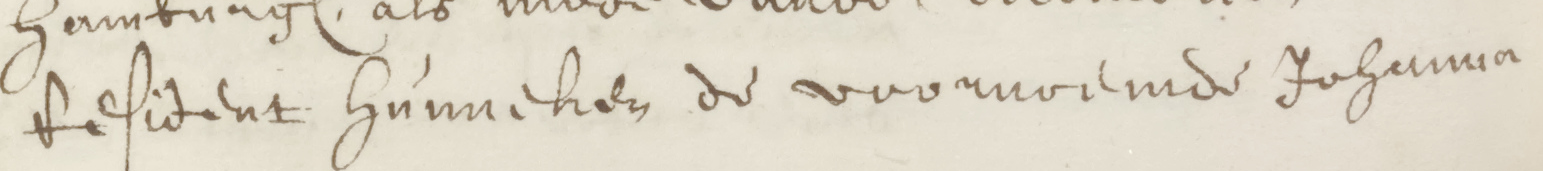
Resident Hunneken de voornoemde Johanna
